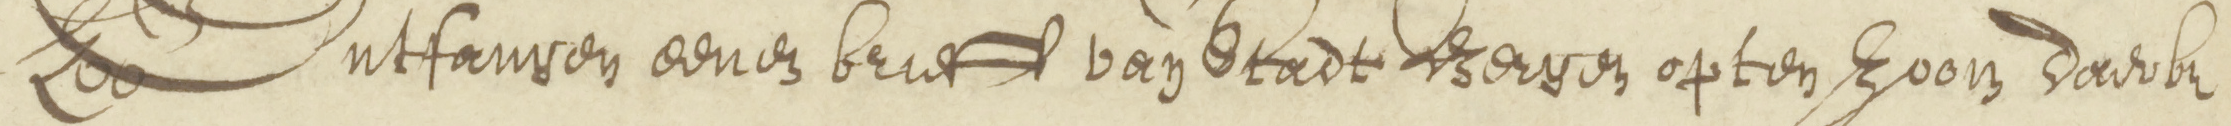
Ontfangen eenen brieff van Stadt Bergen opten zoom daerby
